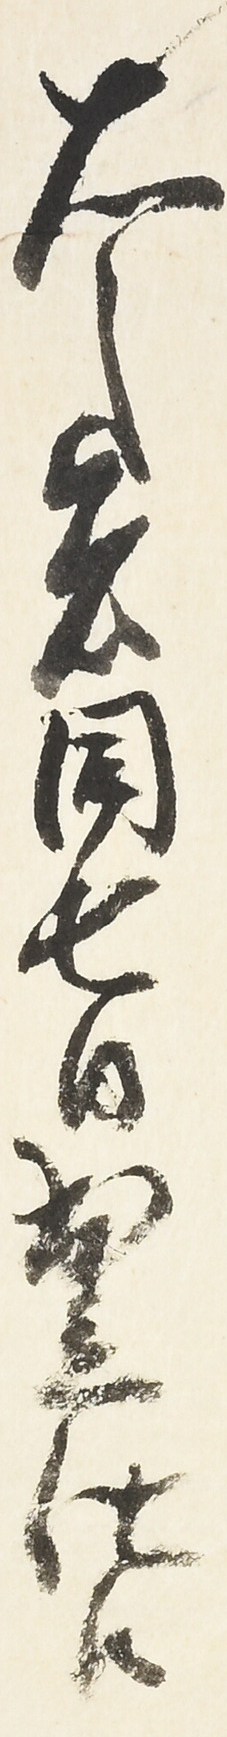右之者同七日出立仕候
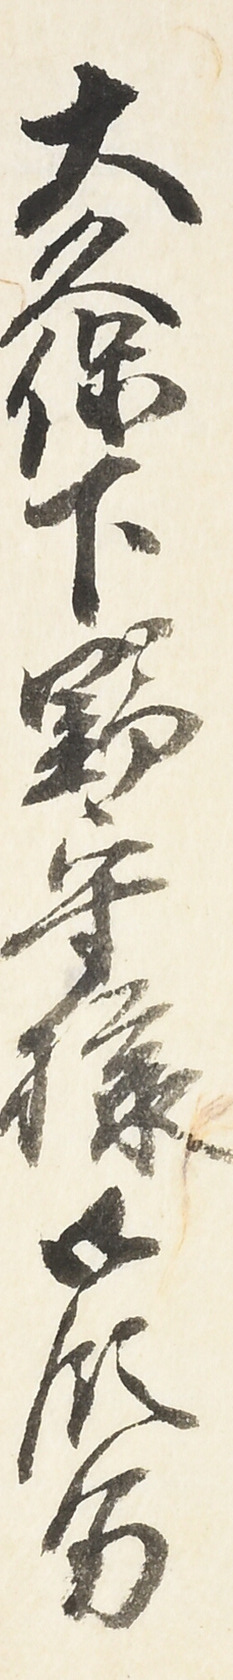大久保下野守様御領分
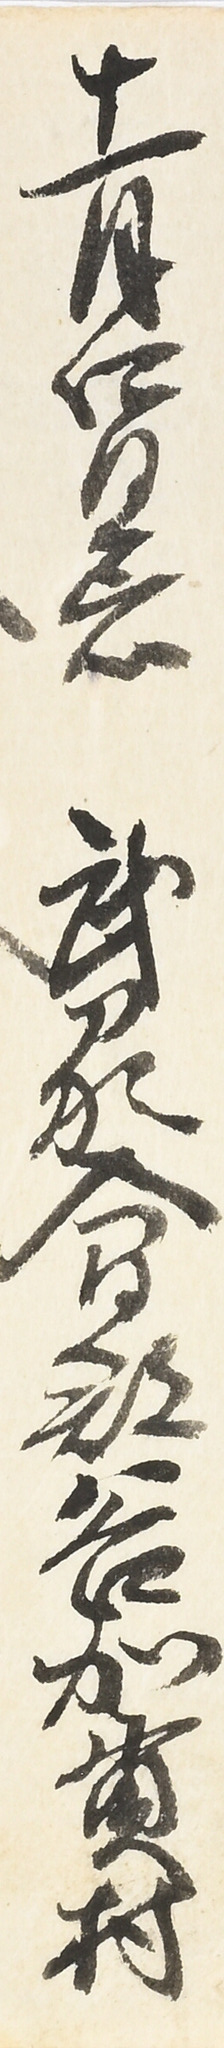十一月四日着武州入間郡谷加貫村
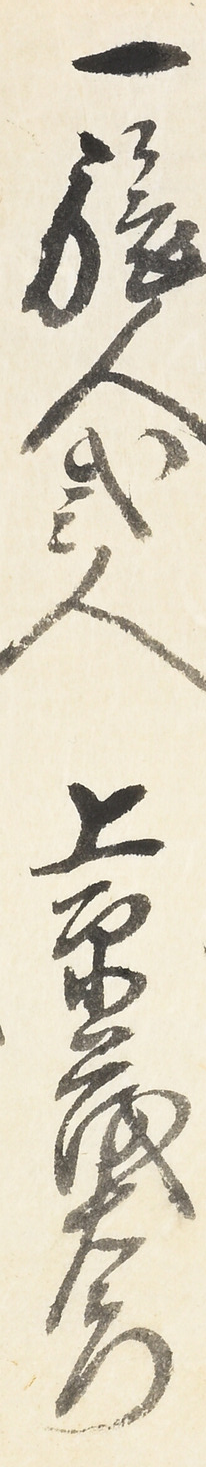一旅人弐人上原茂右衛門
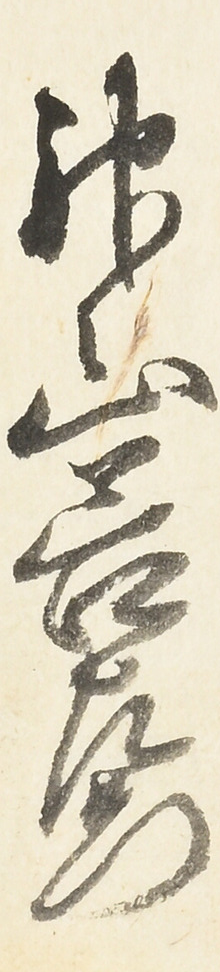神山善左衛門
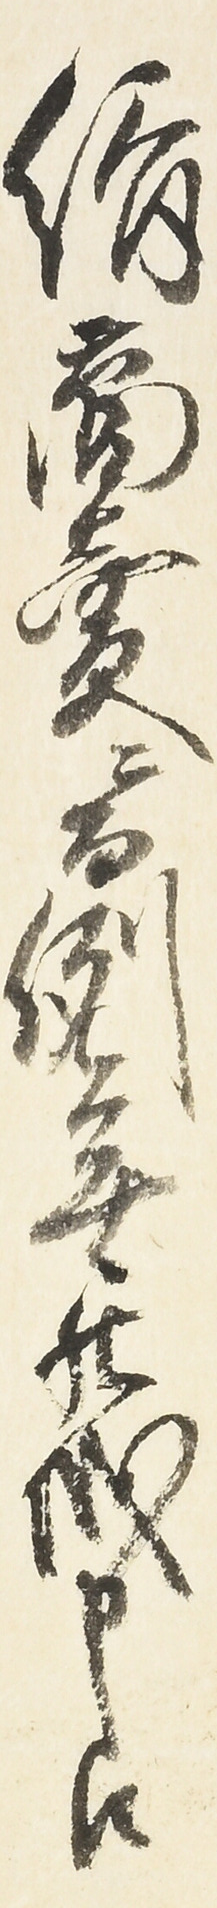絹商売ニ而例年罷越申候
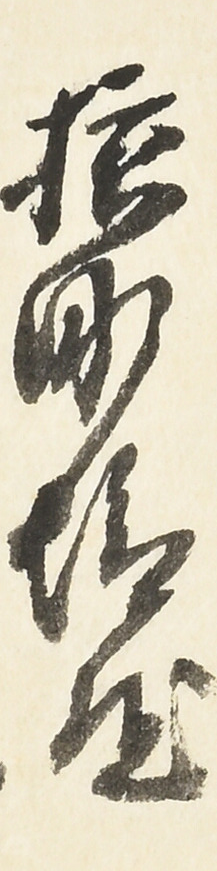横町塩屋
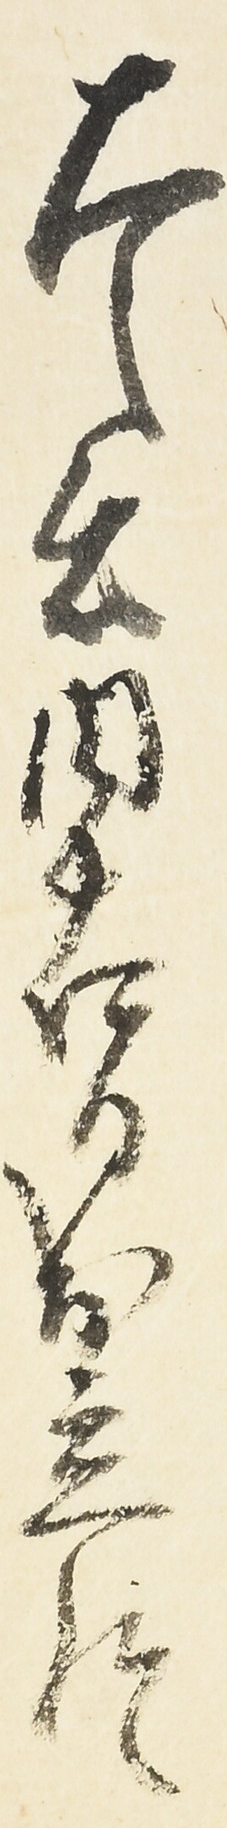右之者同十四日出立仕候
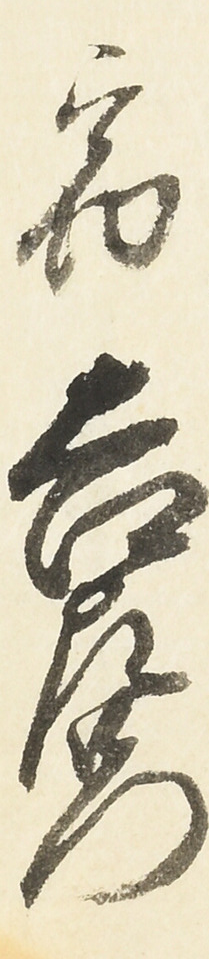宿吉左衛門
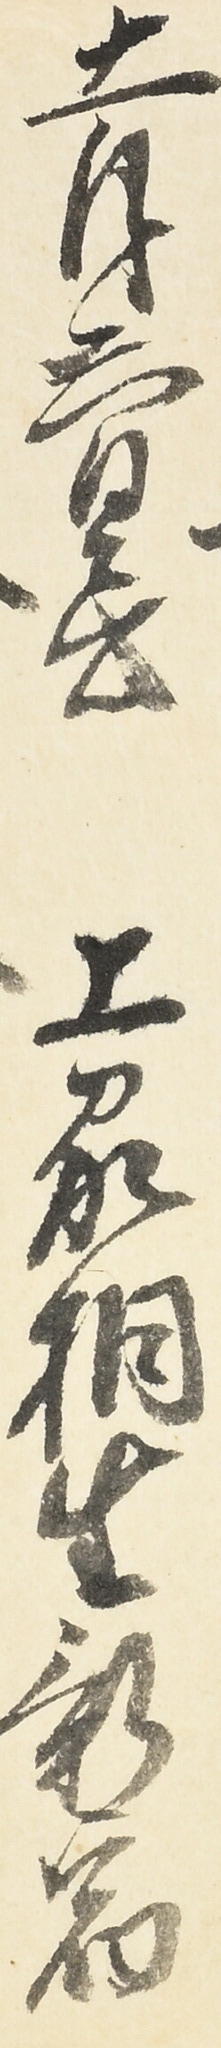十一月六日着上州桐生新宿
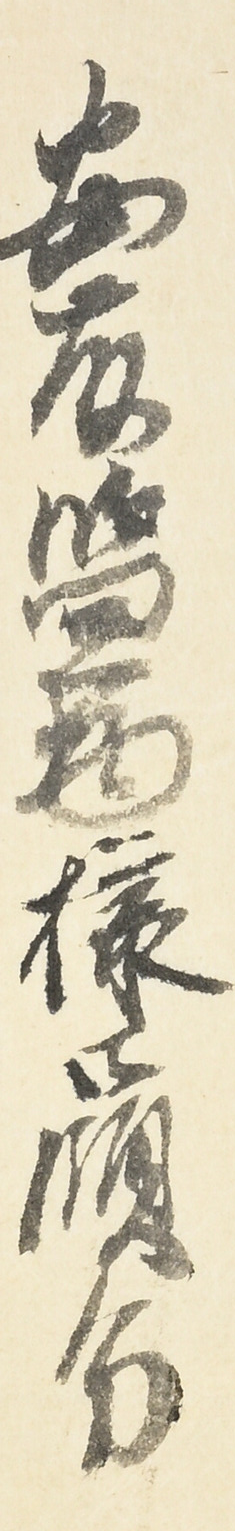安藤監物様御領分
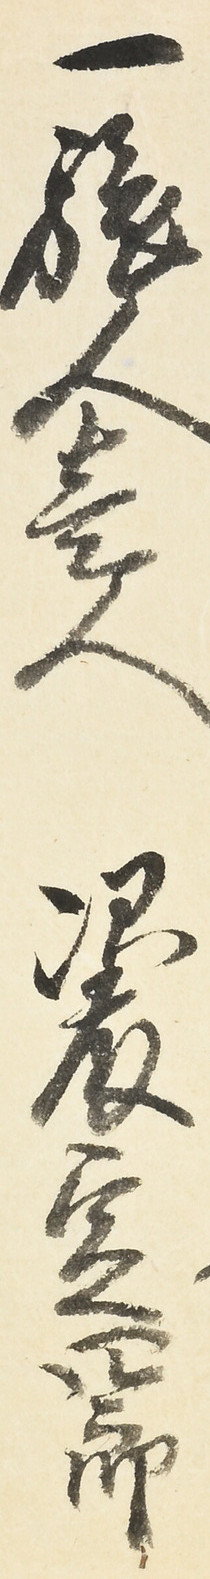一旅人壱人次藤定四郎
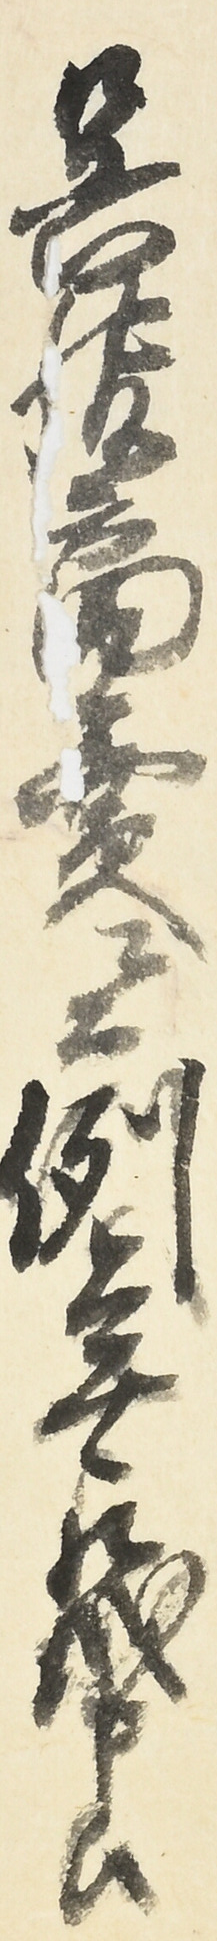呉服商売ニ而例年罷越申候
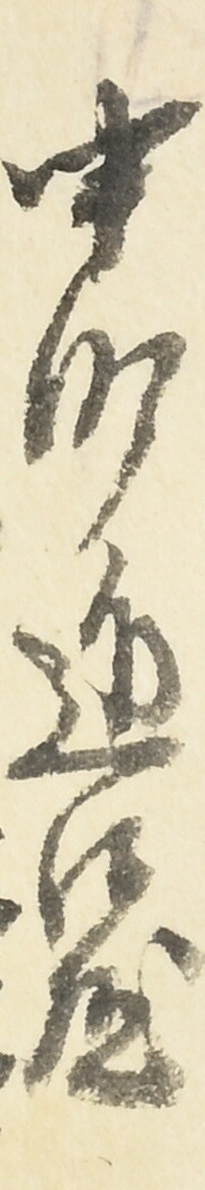中町近江屋
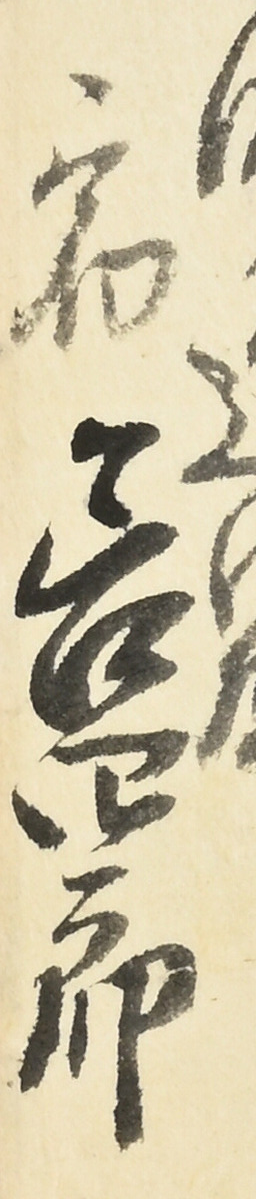宿善四郎
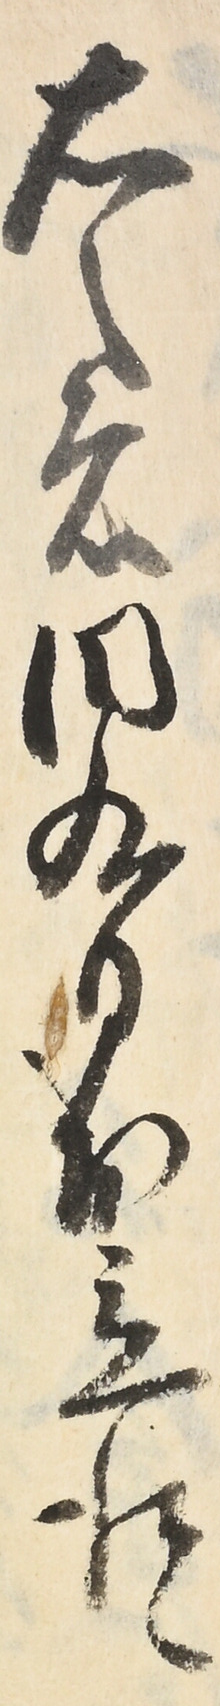右之者同七日出立仕候
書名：町中旅人泊控帳
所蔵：伊那市立高遠町図書館・合同会社AMANE
